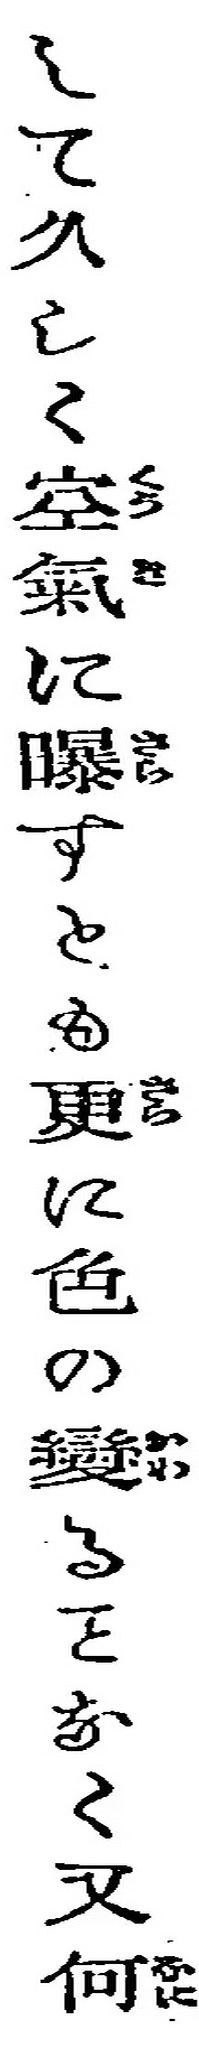して久し空気に曝すとも更に色の変ることなく又何
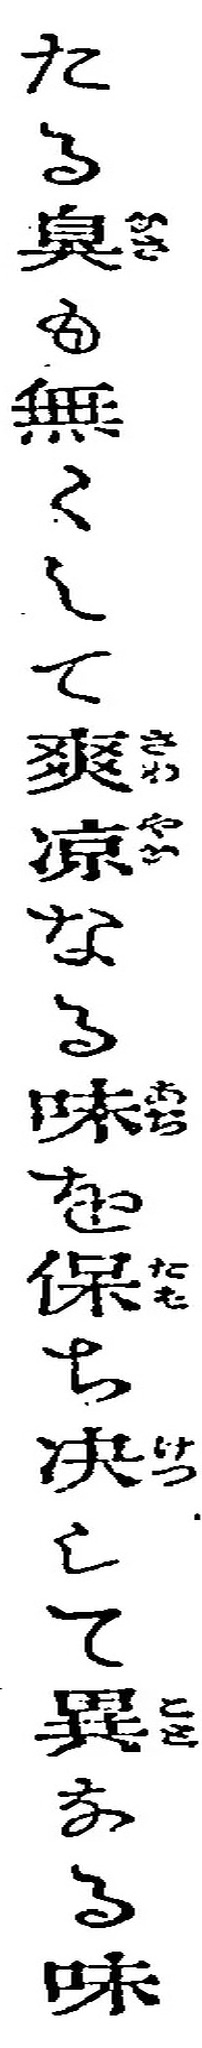たる臭も無くして爽涼なる味を保ち決して異なる味
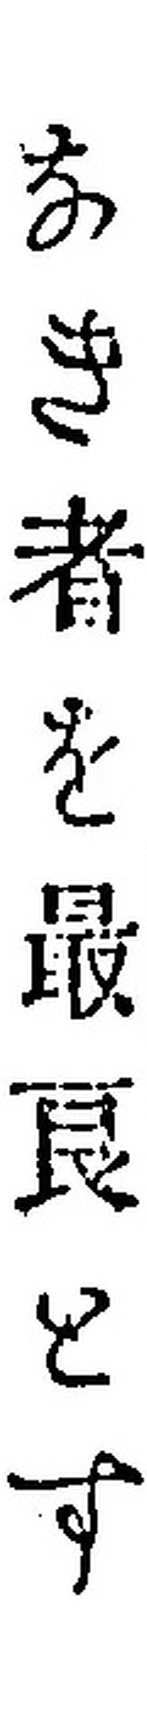なき者を最良とす
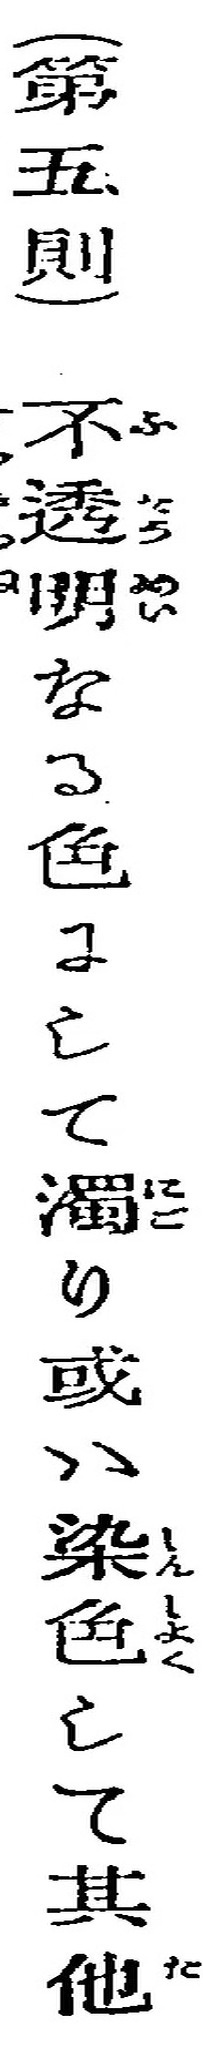[第五則]不透明なる色にして濁り或は染色して其他
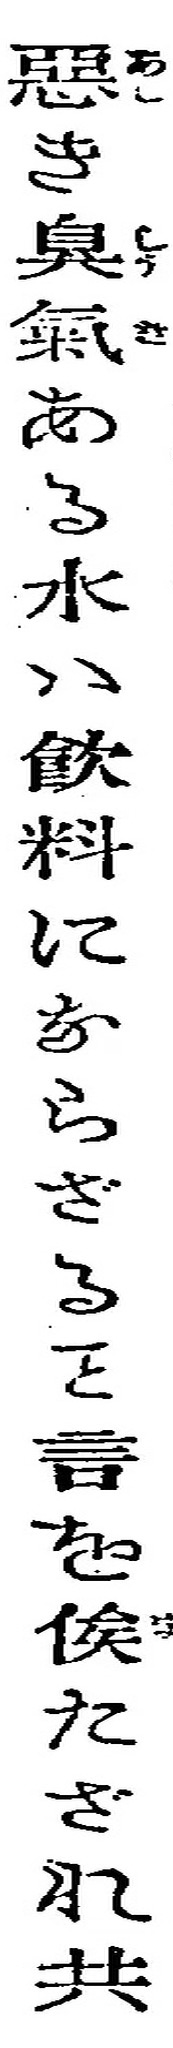悪き臭気ある水は飲料にならざること言を俟たざれ共
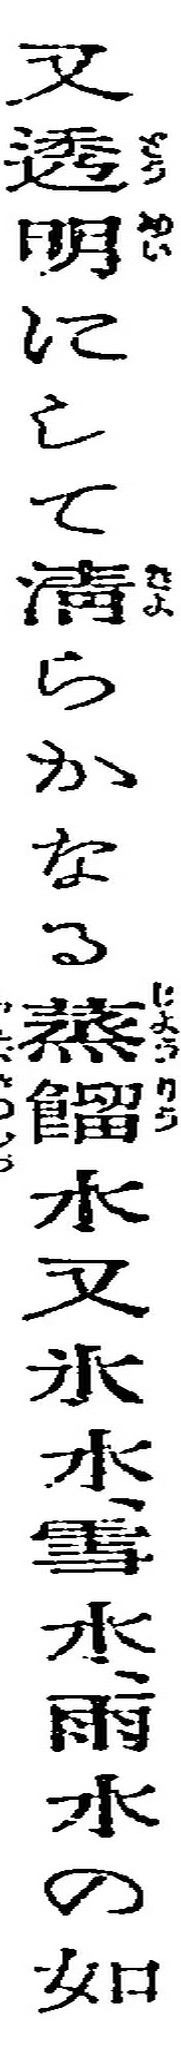又透明にして清らかなる蒸餾水又氷水、雪水、雨水の如
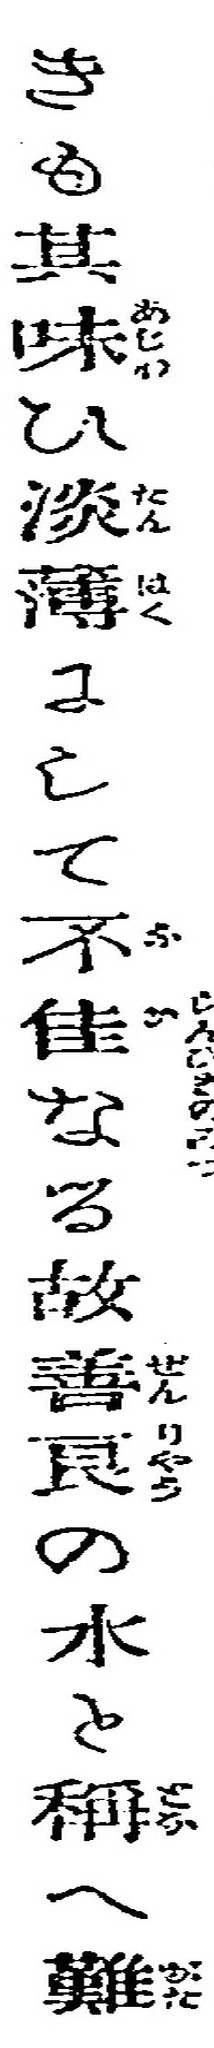きも其味ひ淡薄にして不佳なる故善良の水と稱へ難
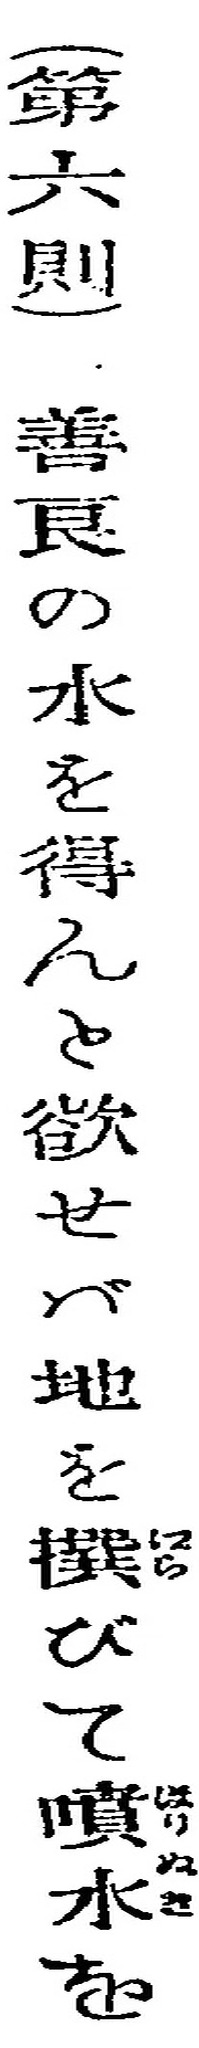[第六則]善良の水を得んと欲せば地を撰びて噴水を
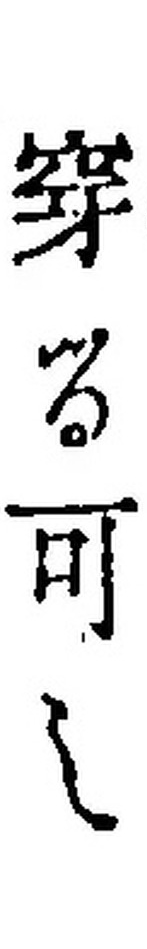穿る可し

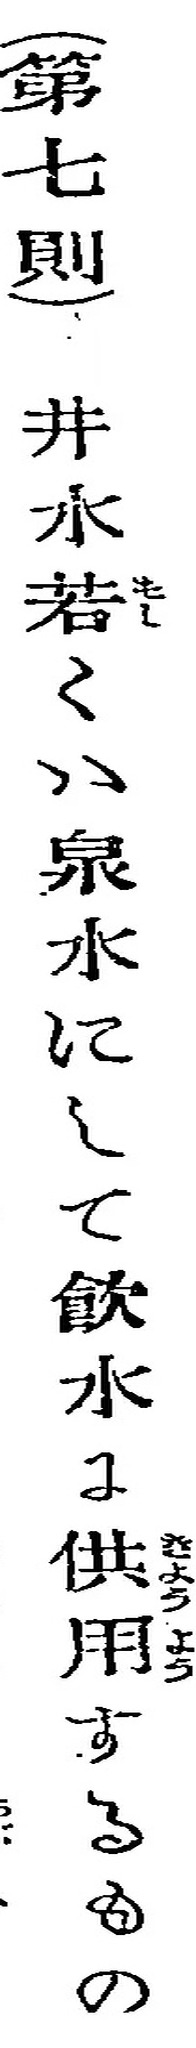[第七則]井水若くは泉水にして飲水に供用するもの
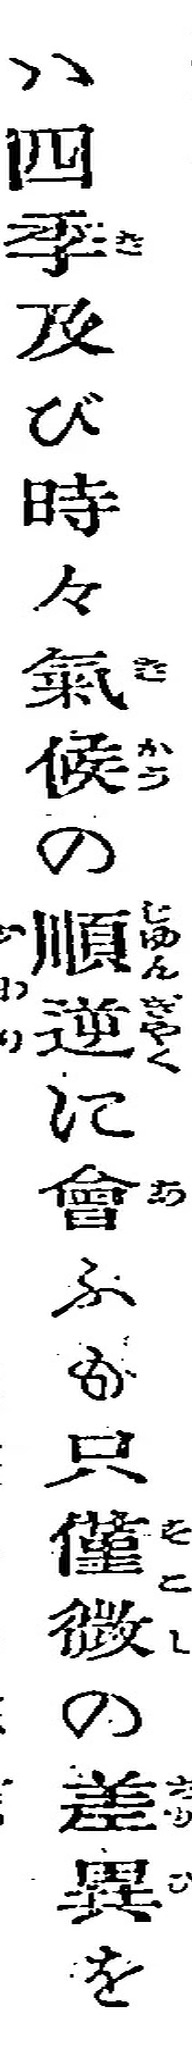は四季及び時々気候の順逆に会ふも只僅微の差異を
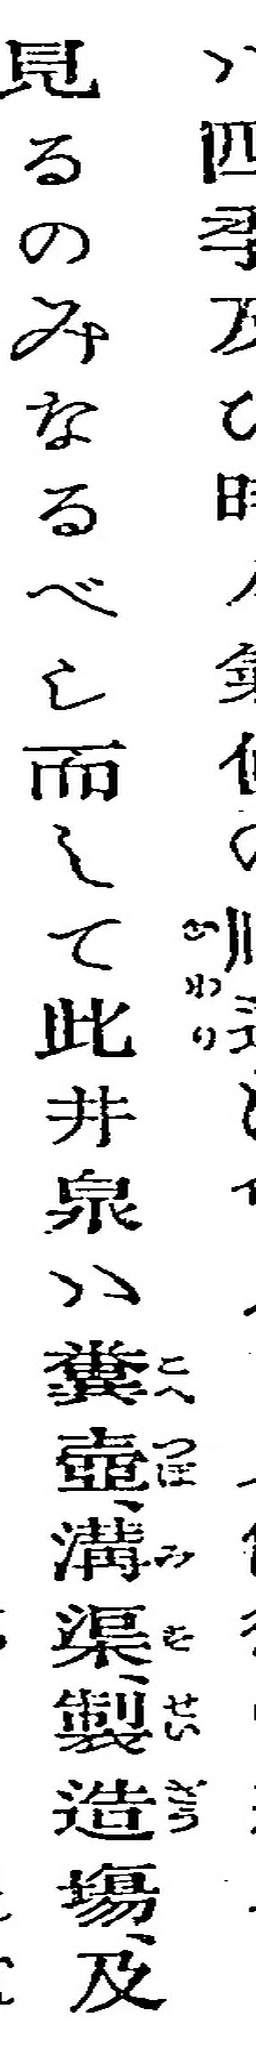見るのみなるべし而して此井泉は糞壺、溝暗、製造場、及
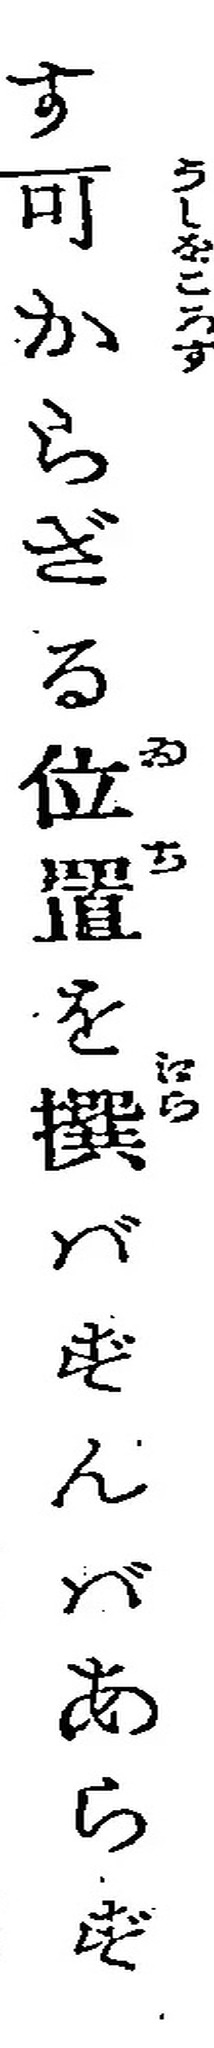す可からざる位置を撰ばずんばあらず
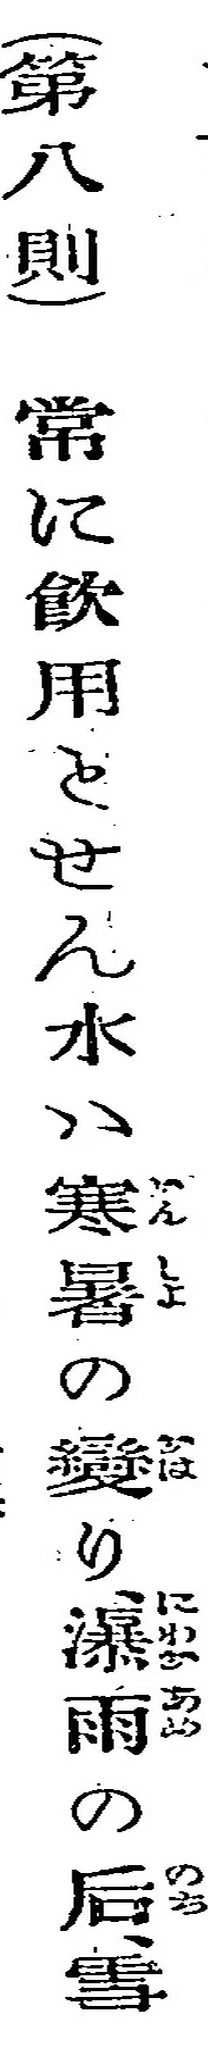[第八則]常に飲用とせん水は寒暑の変り、瀑雨の后、雪
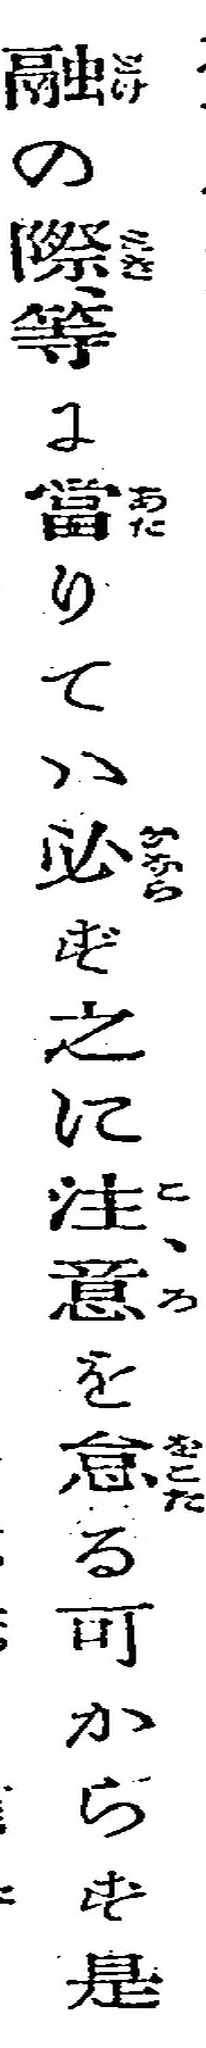融の際等に当りては必ず之に注意を怠る可からず是
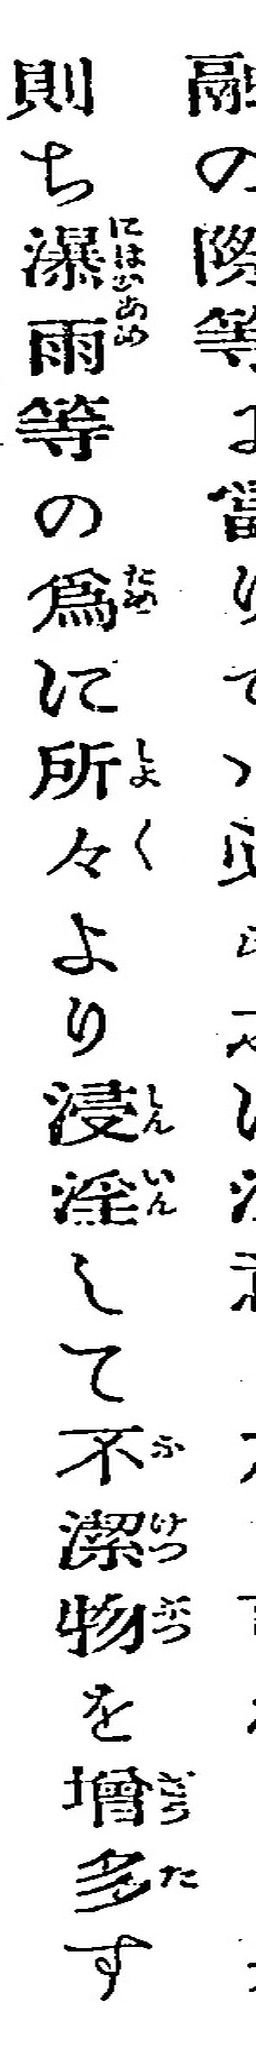則ち瀑雨等の為に所々より浸淫して不潔物を増多す
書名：飲水の心得 : 伝染病の予防
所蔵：国立国会図書館 National Diet Library, JAPAN
